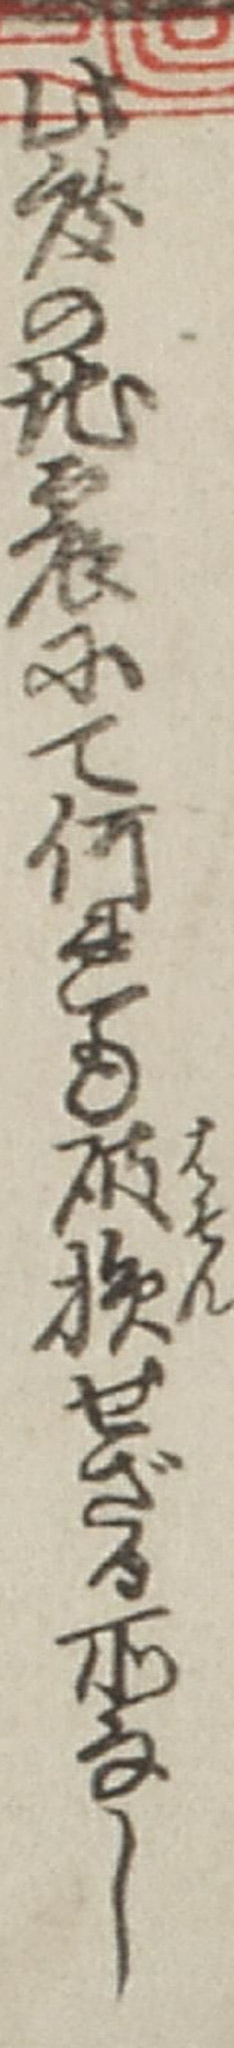此度の地震にて何れも破損せざる所なし芳綱写
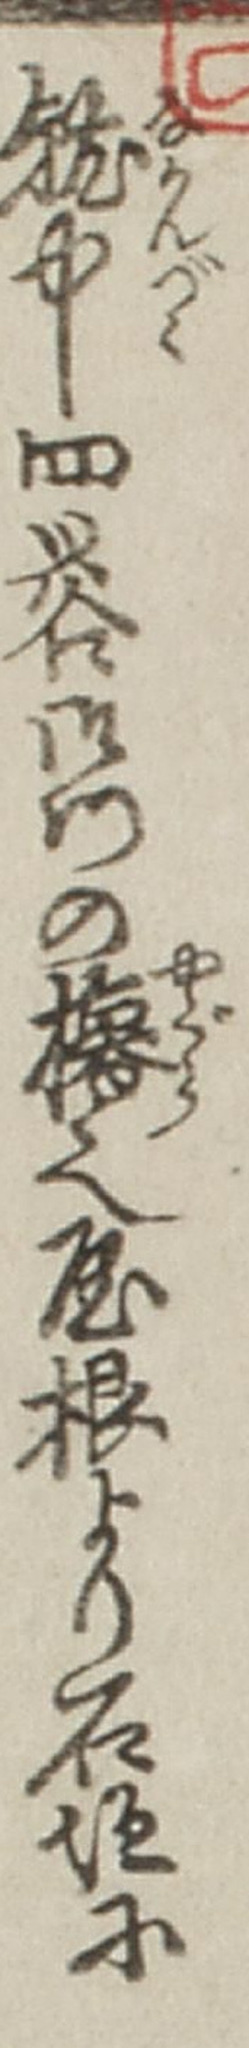就中四ツ谷御門の櫓之屋根より石垣に
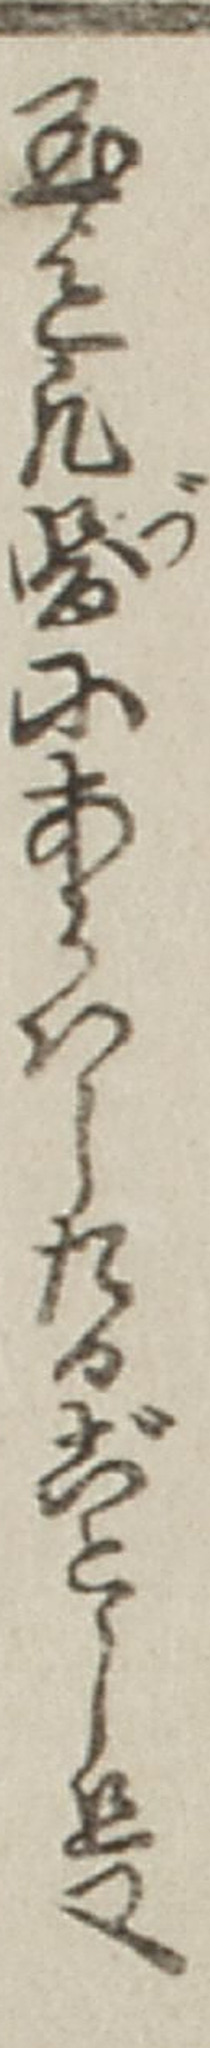至迄凡図にあらはしたるごとし且又
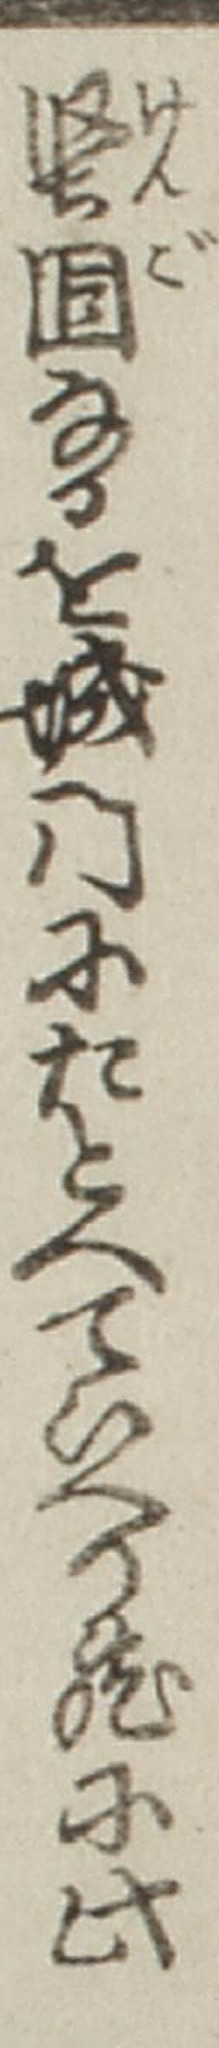堅固なるを城門にたとへていへり然に此
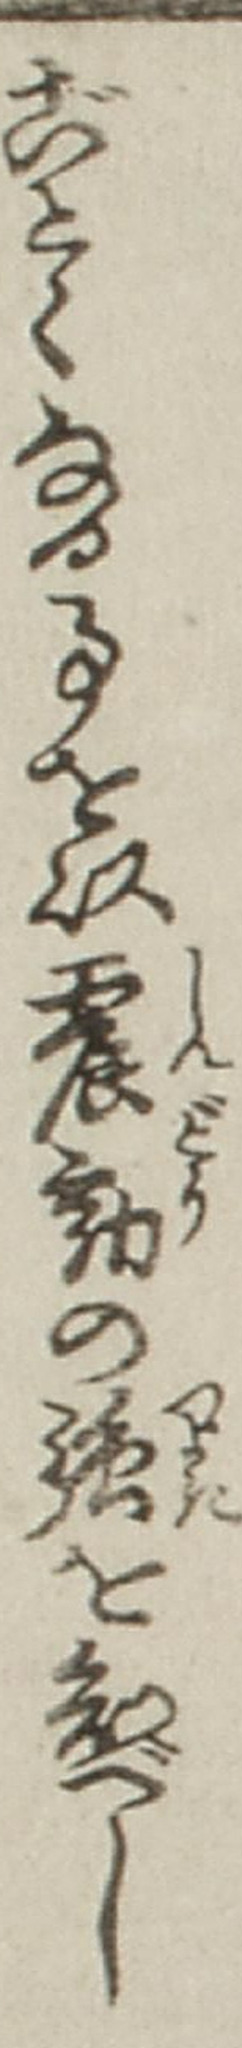ごとくなる事を以震動の強を知べし
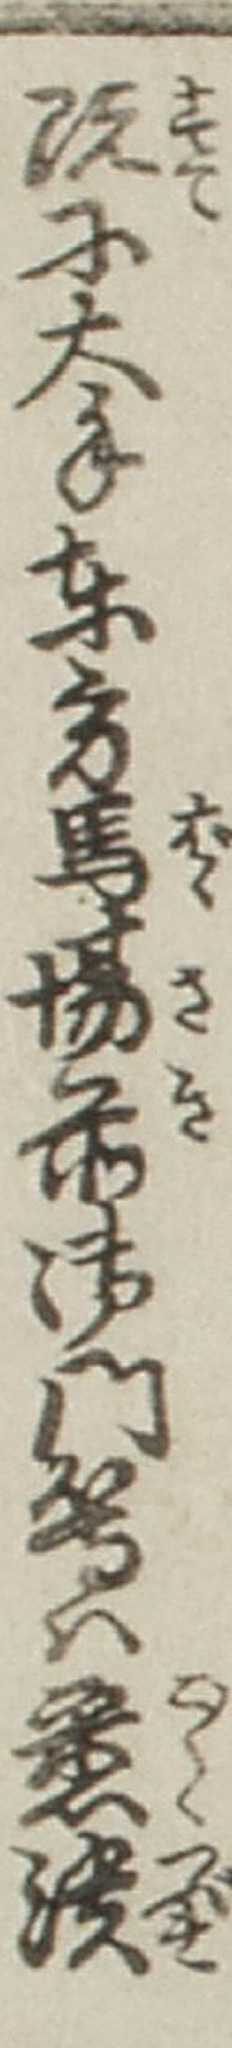既に大手東方馬場前御門等は悉潰
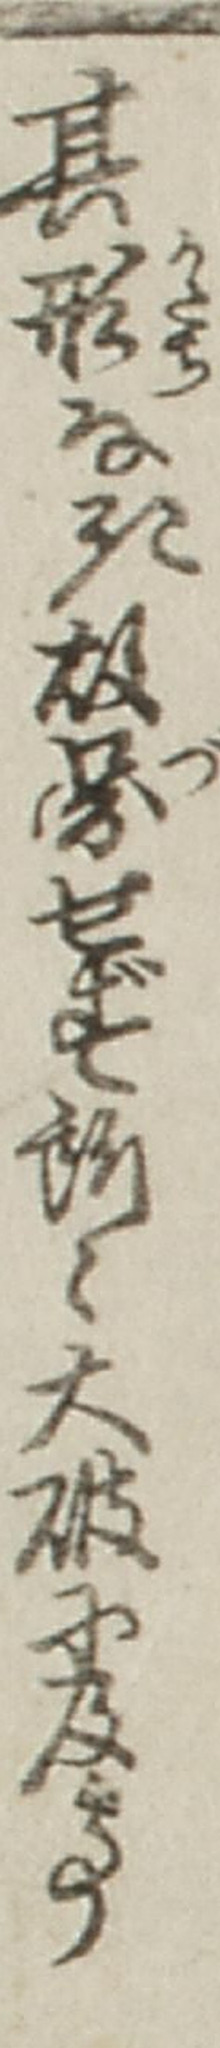其形なき故図せず所々大破に及事
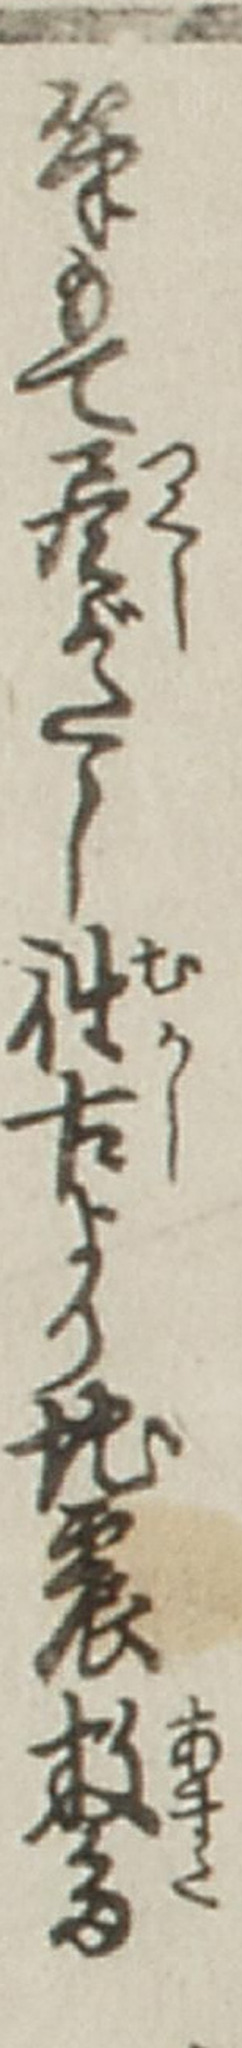筆もて尽がたし往古より地震数多
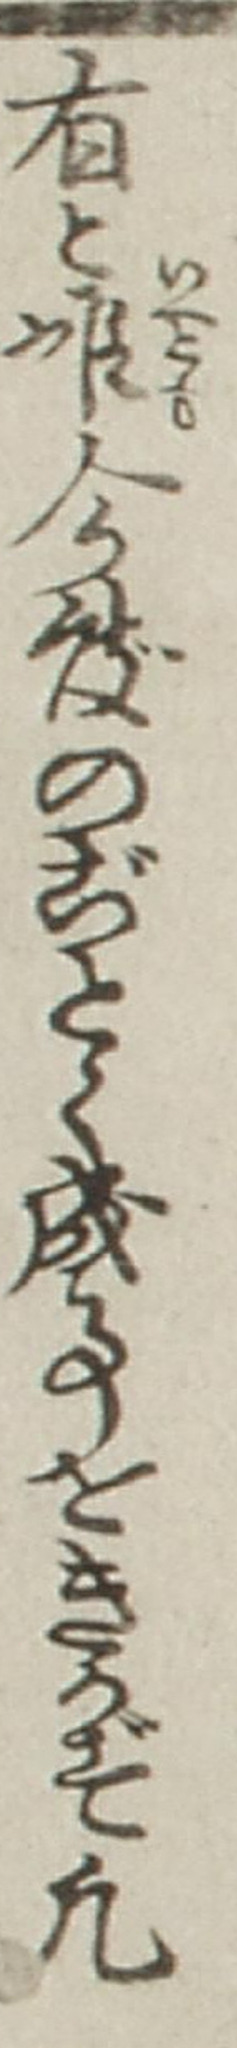有と雖今度のごとく成事をきかず凡
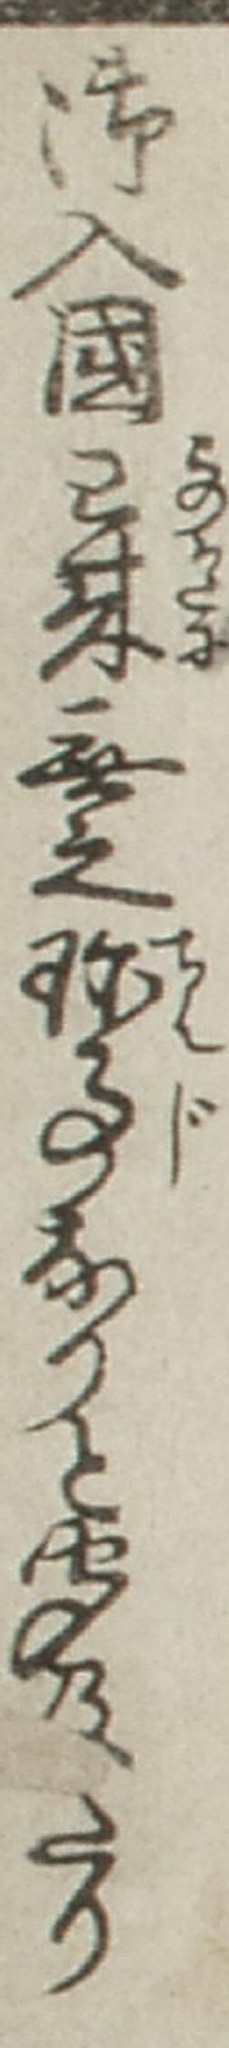御入国已来無之珍事なりと聞及たり

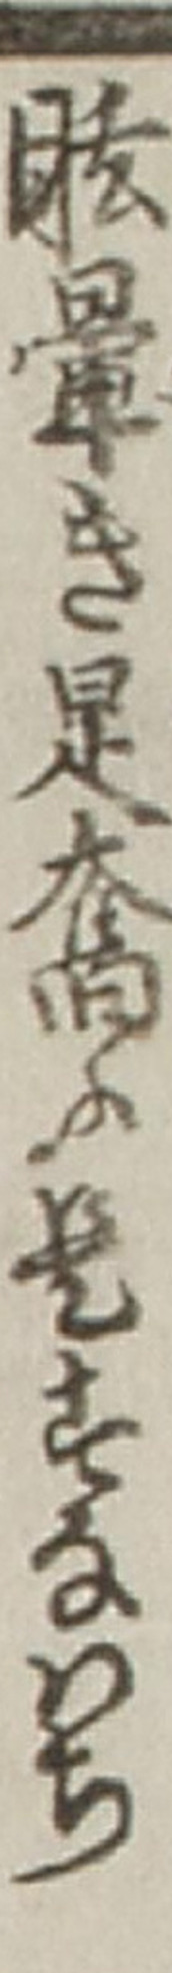眩暈き足奮ふ是すなはち
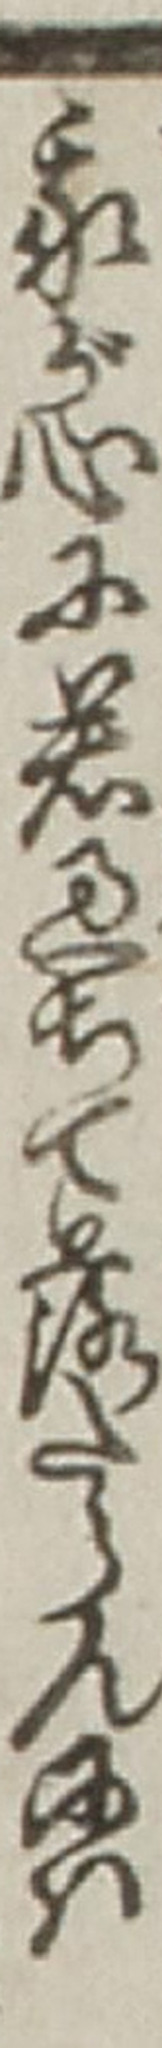我が心に若過ちて落たらんには
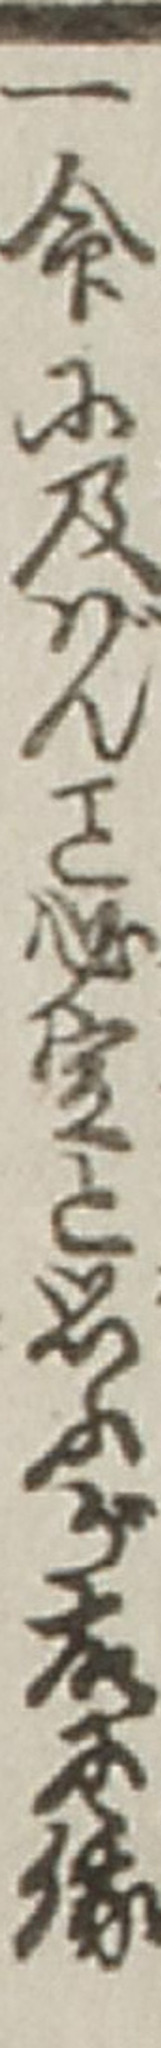一命に及ばんこと必定と思ふが故に俄
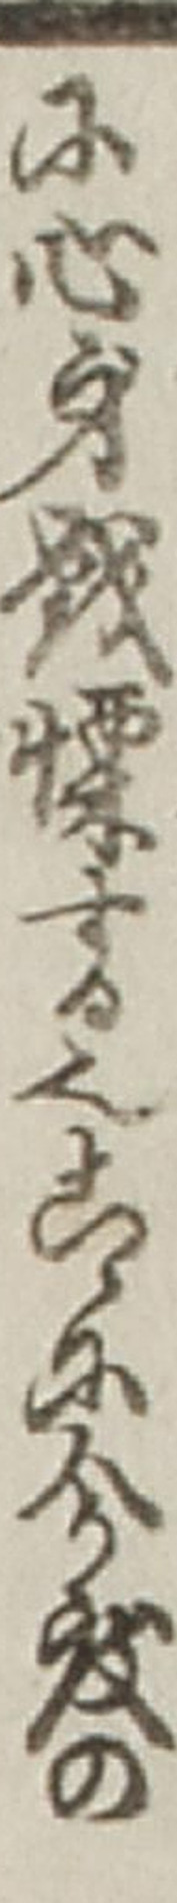に心身戦慄する也こゝに今度の
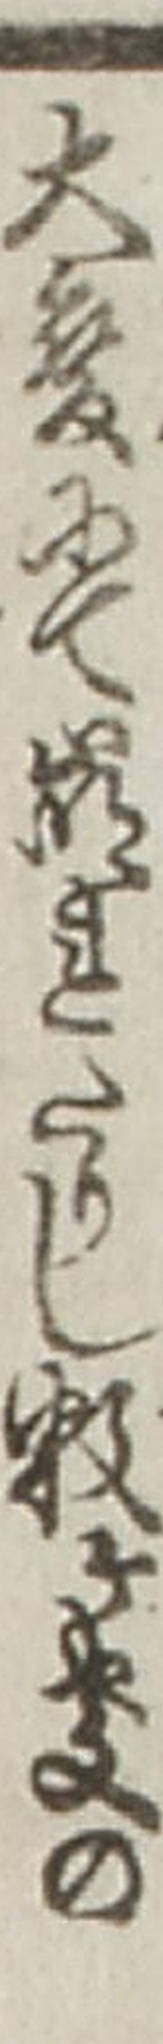大変にて崩れたりし数ケ処の
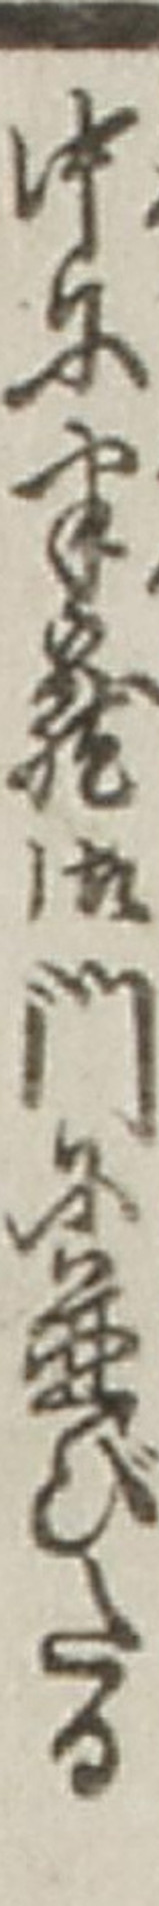中に半蔵御門に並びたる
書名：安政見聞誌　下
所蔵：東京大学地震研究所図書室 Earthquake Research Institute Library, The University of Tokyo, JAPAN
